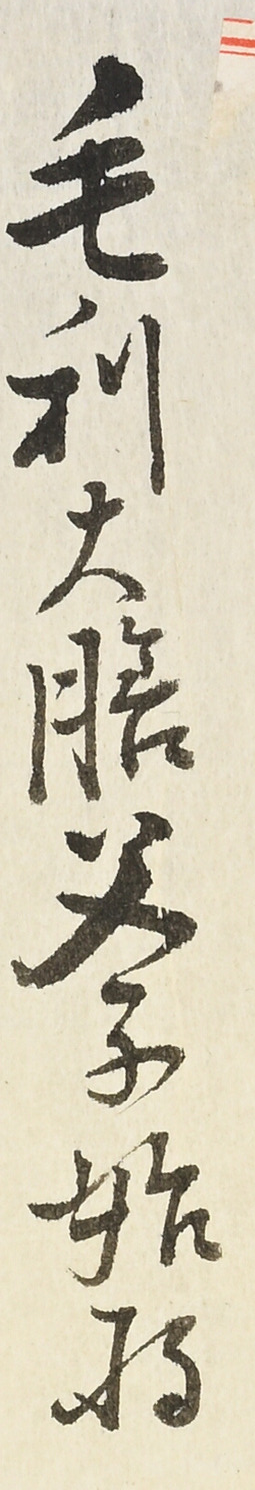毛利大膳父子始為
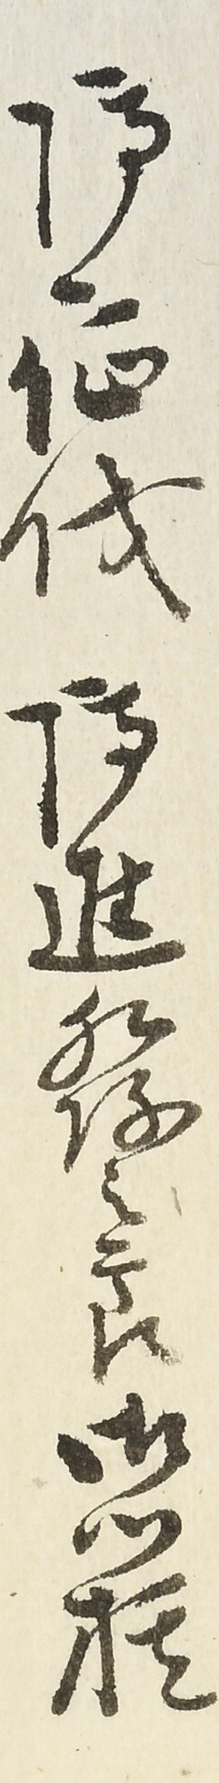御征伐御進発之節御旗
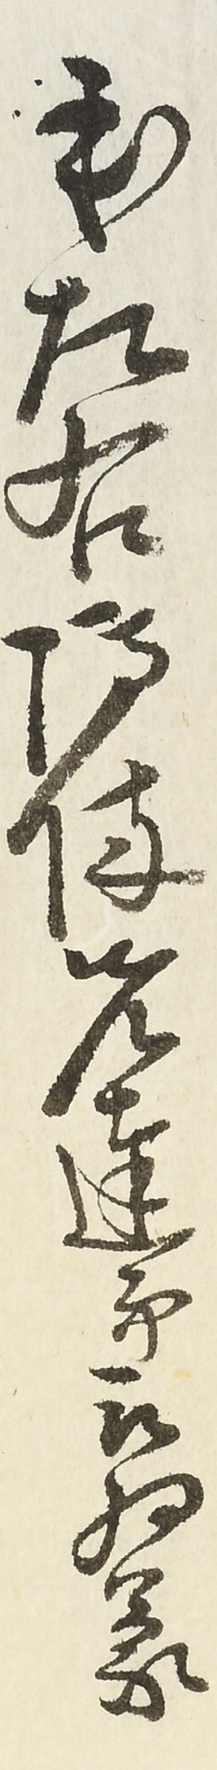本左右御備先達而被為蒙
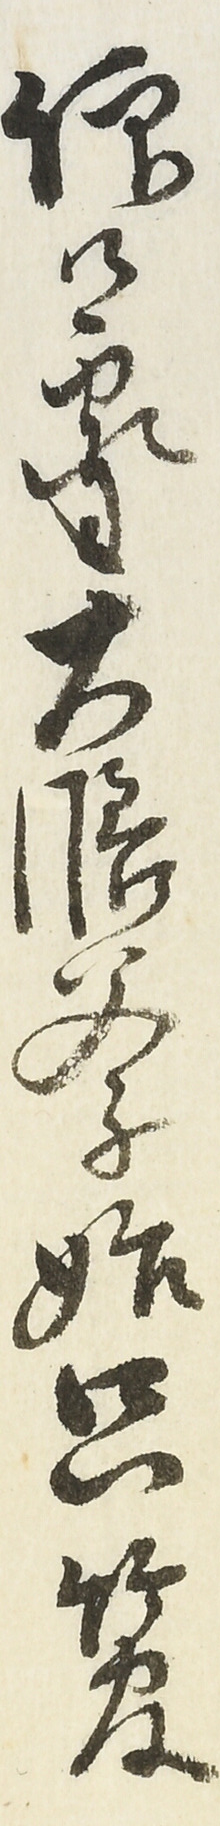仰候処大膳父子始只管
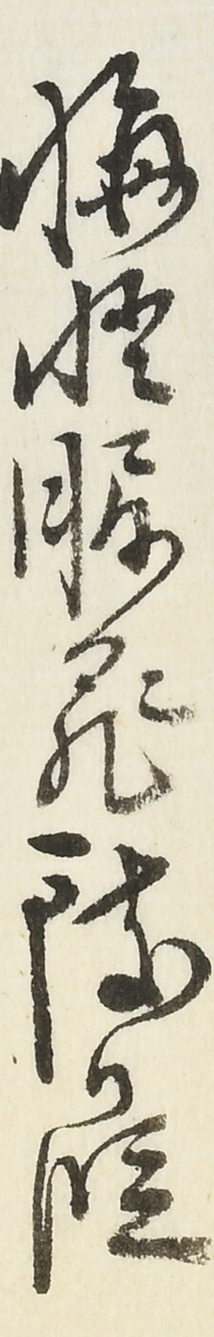悔悟服罪致候段
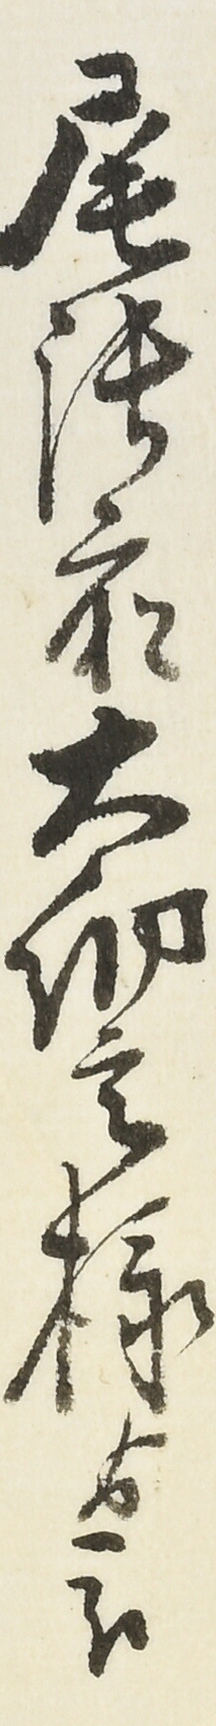尾張前大和守様ゟ被
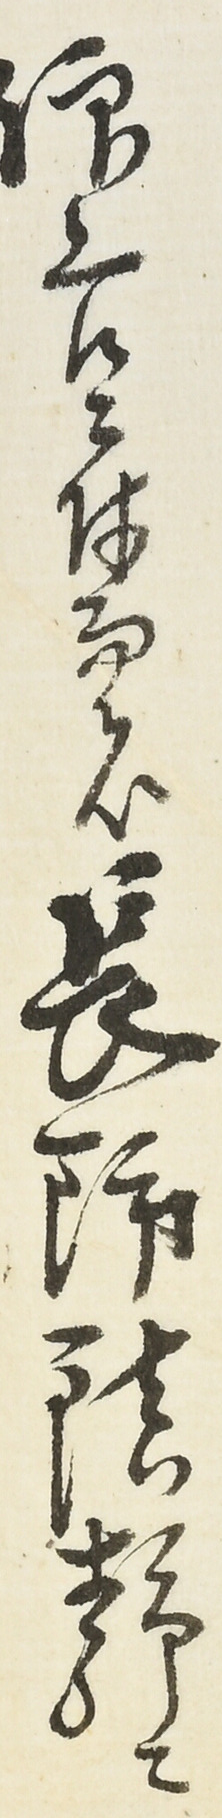仰上候ニ付而者長防鎮静ニ
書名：御触書留
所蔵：伊那市立高遠町図書館・合同会社AMANE
